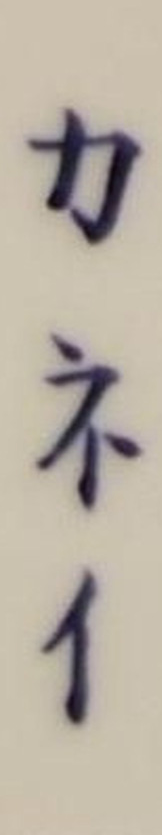カネイ
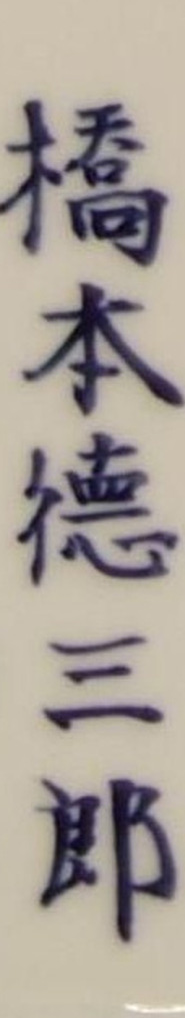橋本徳三郎
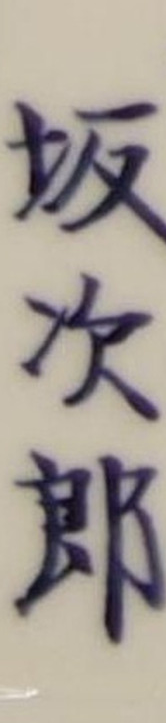坂次郎
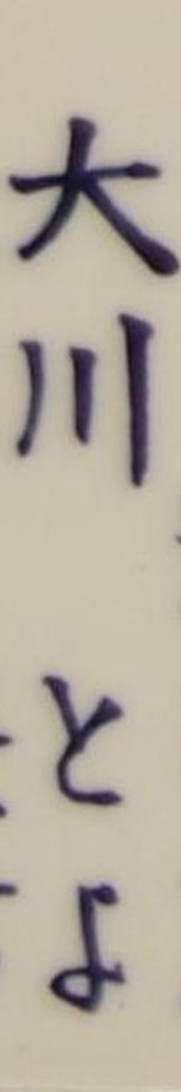大川とよ
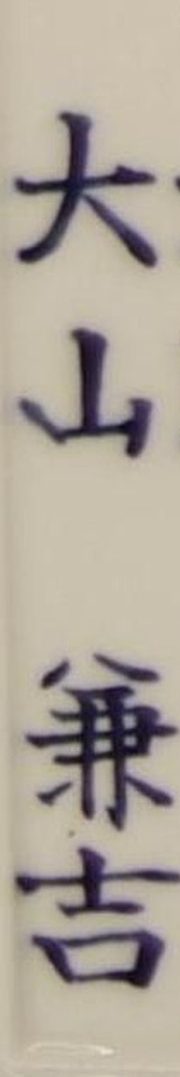大山兼吉

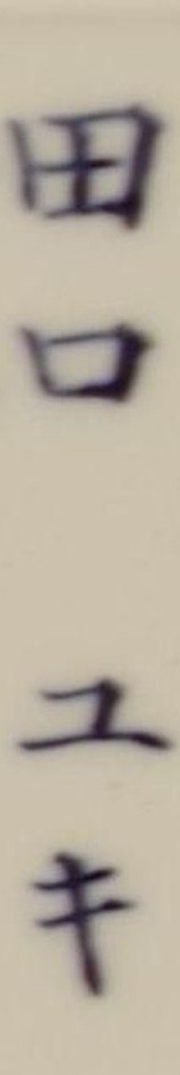田口ユキ
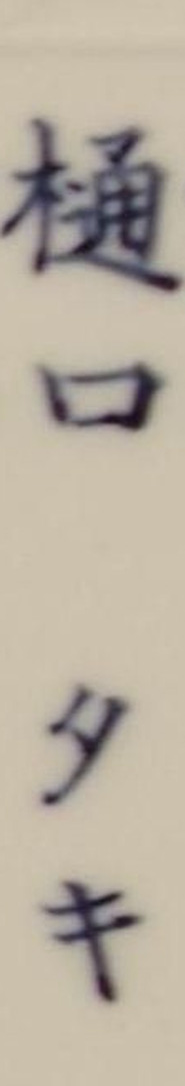樋口タキ
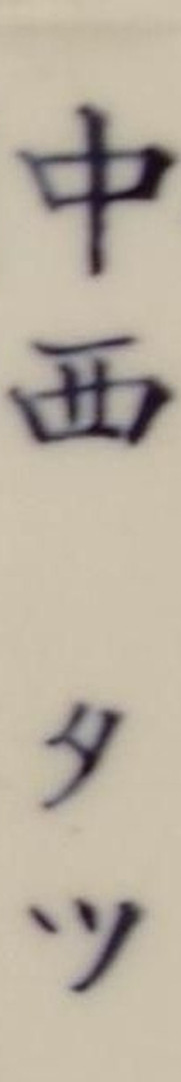中西タツ
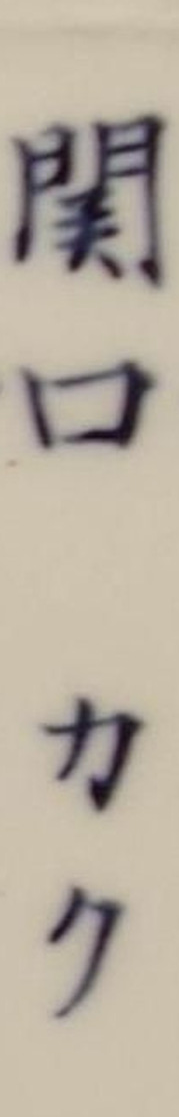関口カク
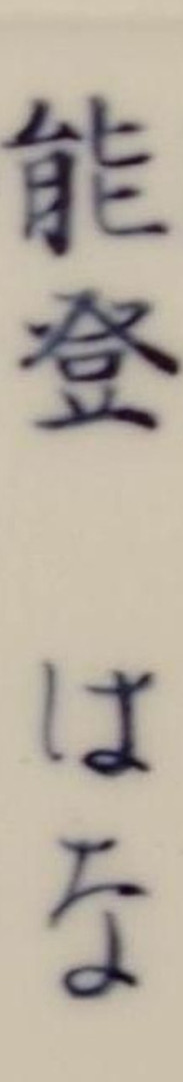能登はな
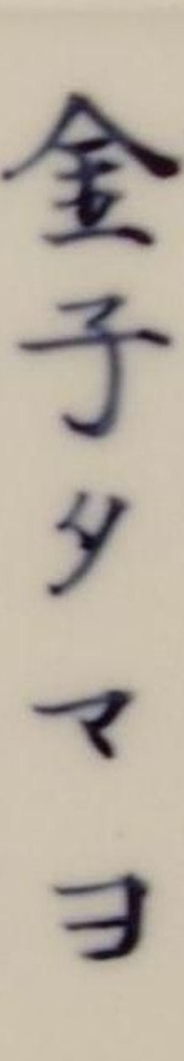金子タマヨ
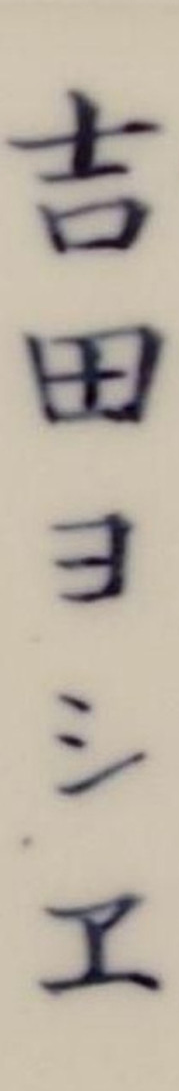吉田ヨシエ
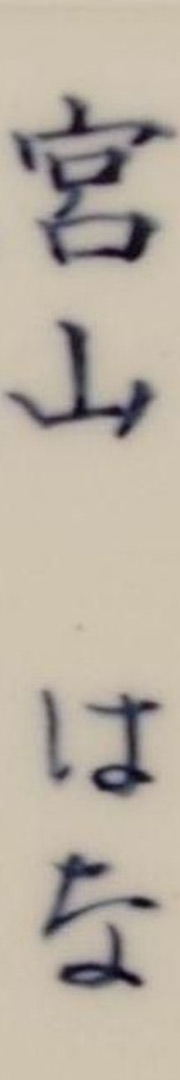宮山はな
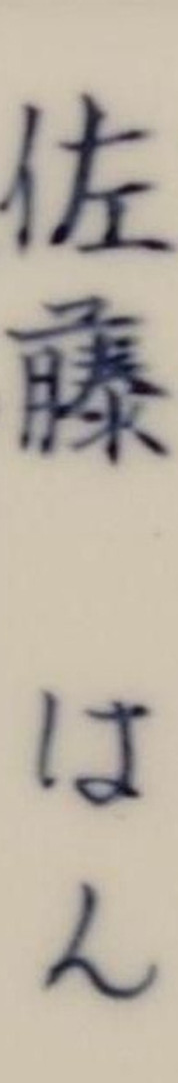佐藤はん
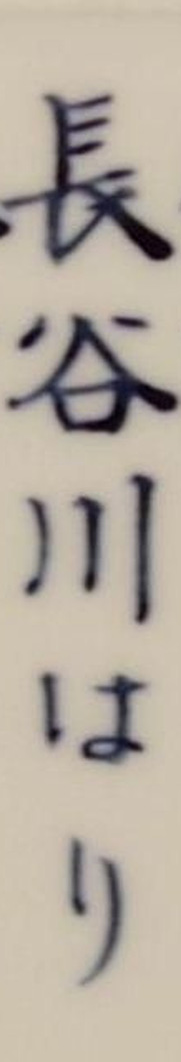長谷川はり
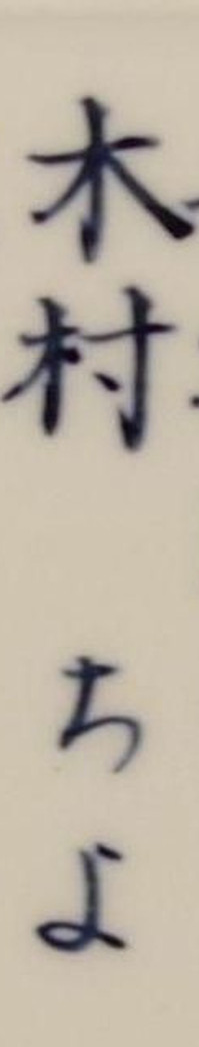木村ちよ
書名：M~S
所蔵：高野山金剛峯寺
